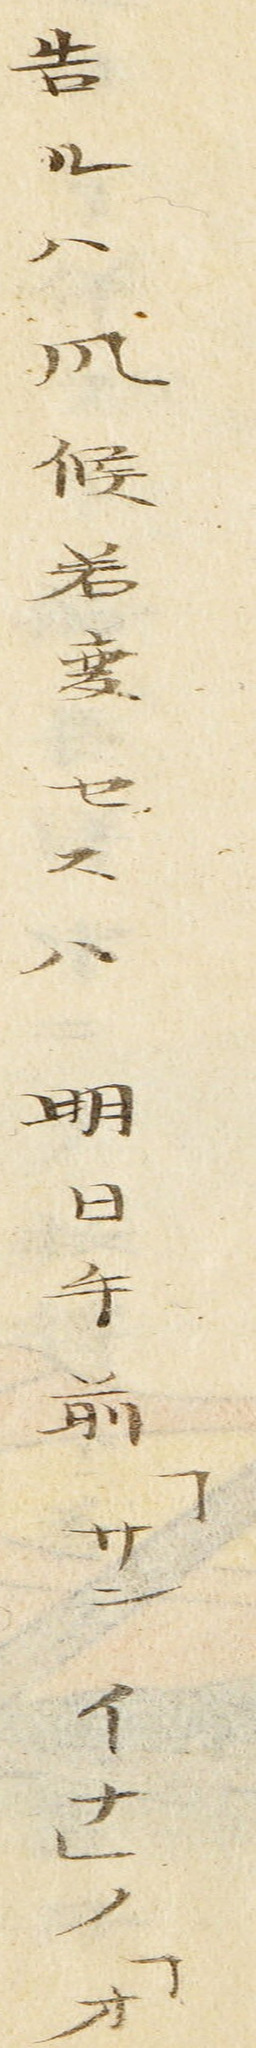告ルハ風候若変セスハ明日午前「サンイナ」ノ「オ
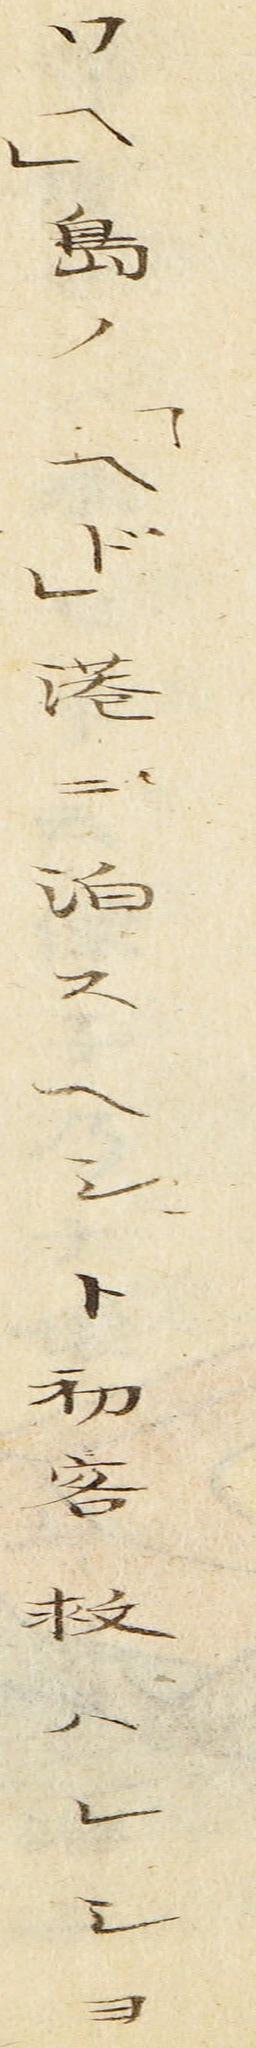ワヘ」島ノ「ヘド」港ニ泊スヘシト初客救ハレシヨ
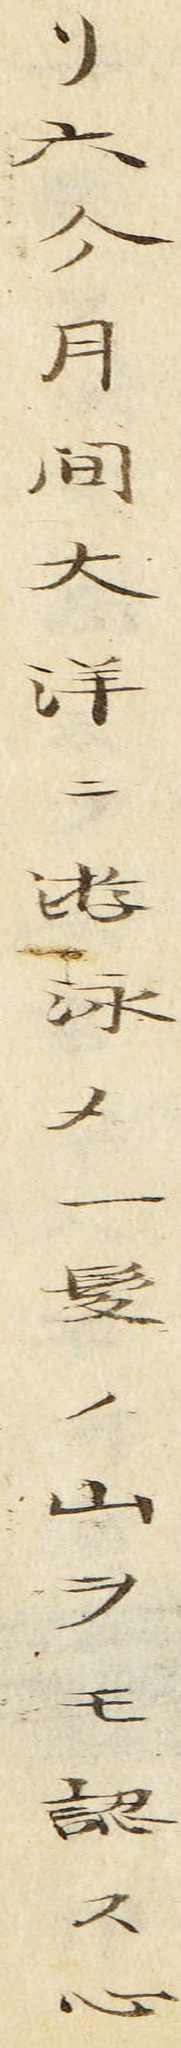リ六个月間大洋ニ遊泳シテ一髪ノ山ヲモ認ス心
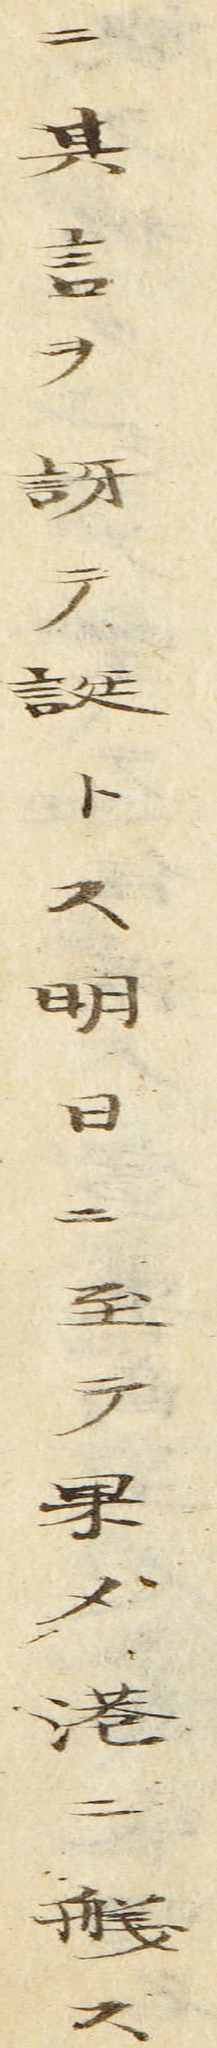ニ其言ヲ訝テ誕トス明日ニ至テ果シテ港ニ艤ス
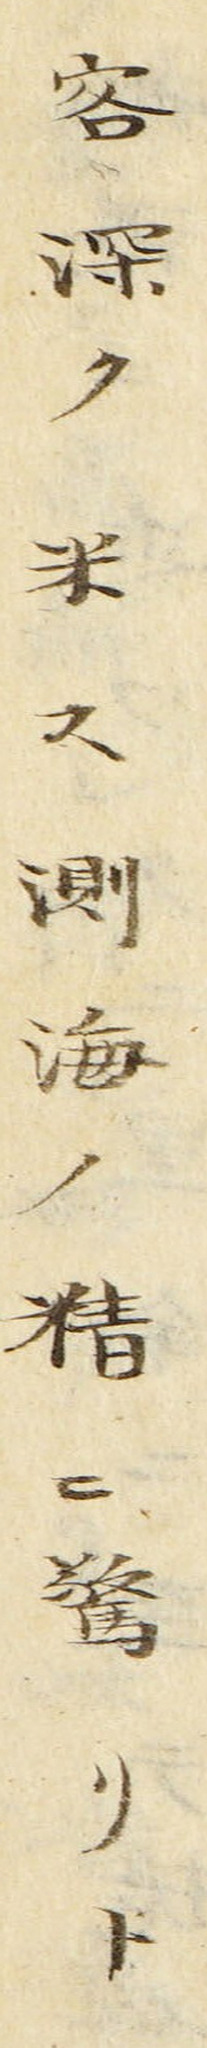客深ク米ス測海ノ精ニ驚リト

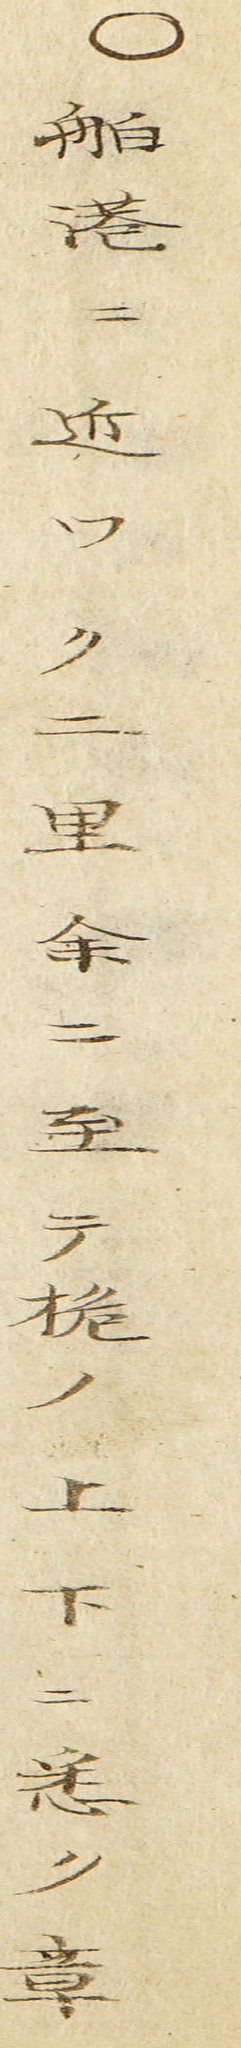○舶港ニ近ツク二里余ニ至テ桅ノ上下ニ悉ク章
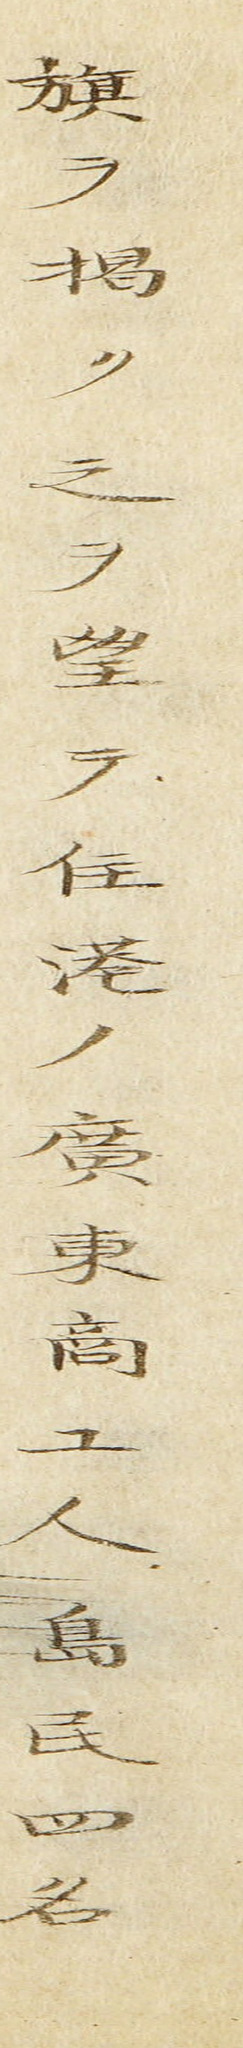旗ヲ掲ク之ヲ望テ住港ノ広東商工人島民四名
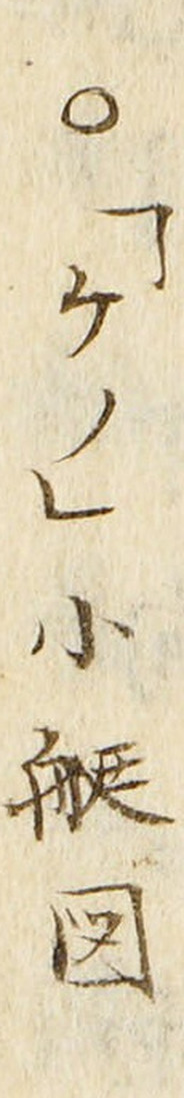◦「ケノ」小艇図
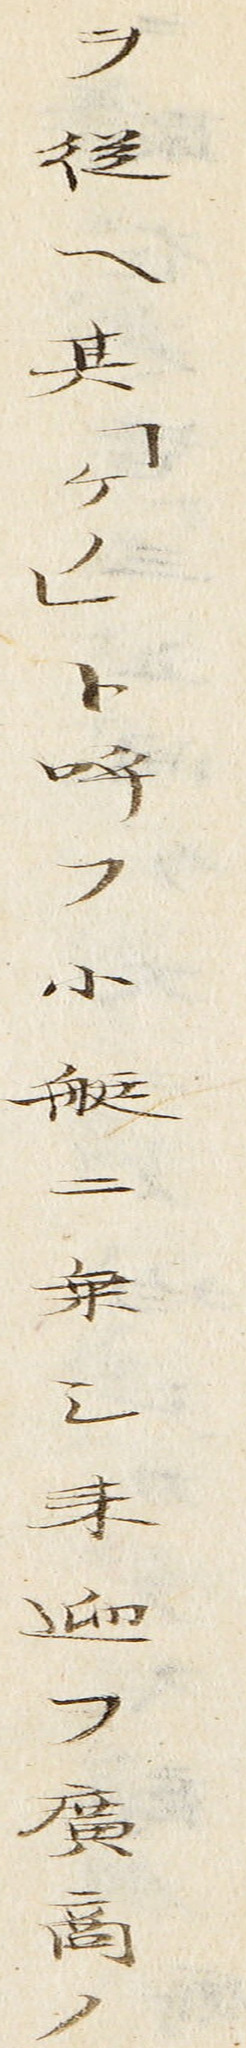ヲ従ヘ其「ケノ」ト呼フ小艇ニ乗シ来迎フ広商ノ
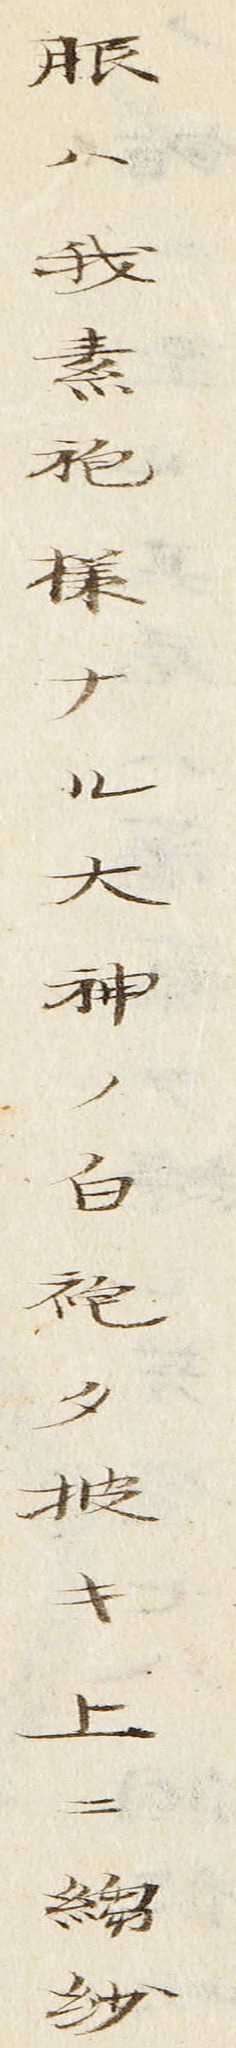服ハ我素袍様ナル大神ノ白袍タ披キ上ニ縐紗
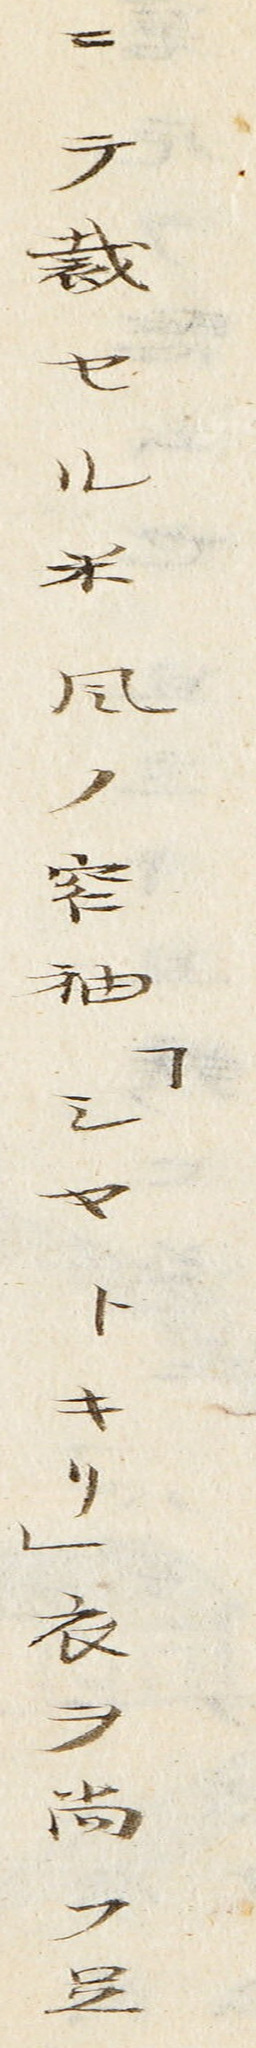ニテ裁セル米風ノ窄袖「シヤトキリ」衣ヲ尚フ足
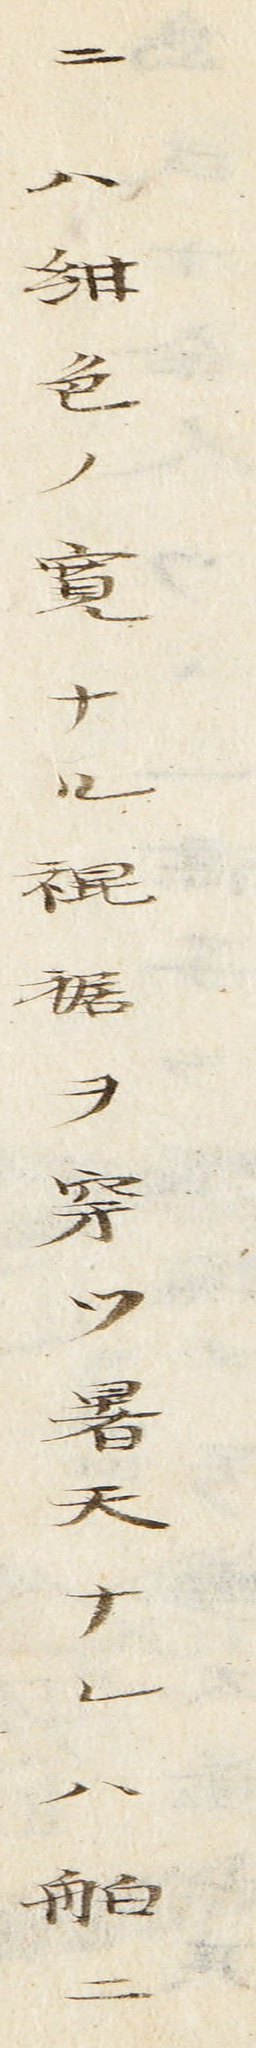ニハ紺色ノ寛ナル裩裾ヲ穿ツ暑天ナレハ舶ニ
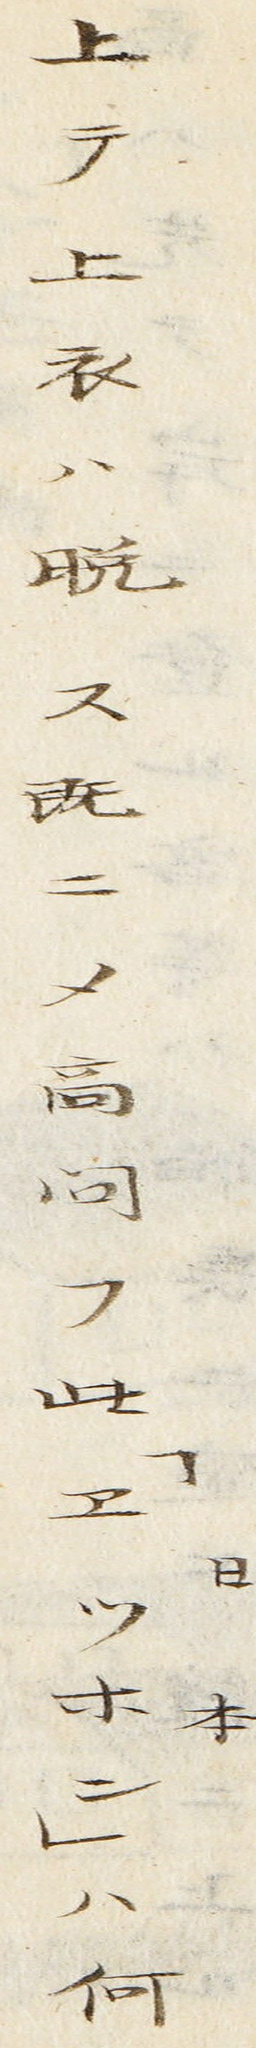上テ上衣ハ脱ス既ニシテ高問フ此「ヱツホン」ハ何
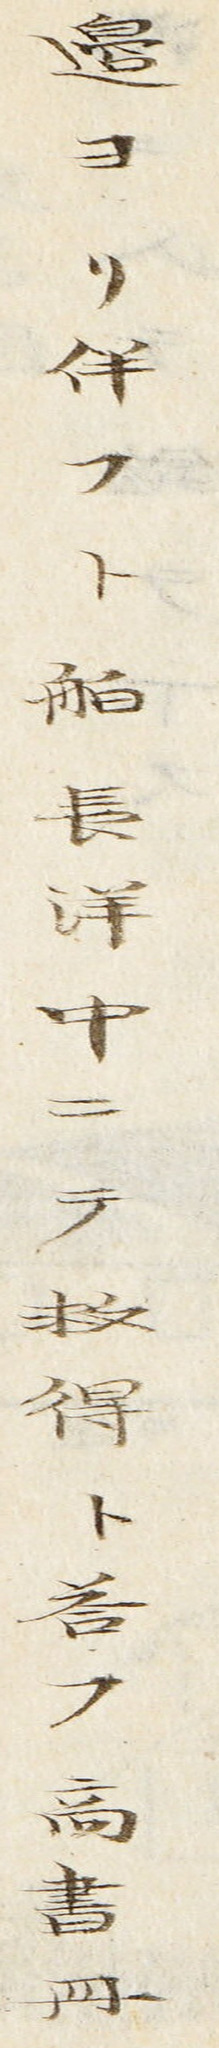辺ヨリ伴フト舶長洋中ニテ救得ト答フ高書冊
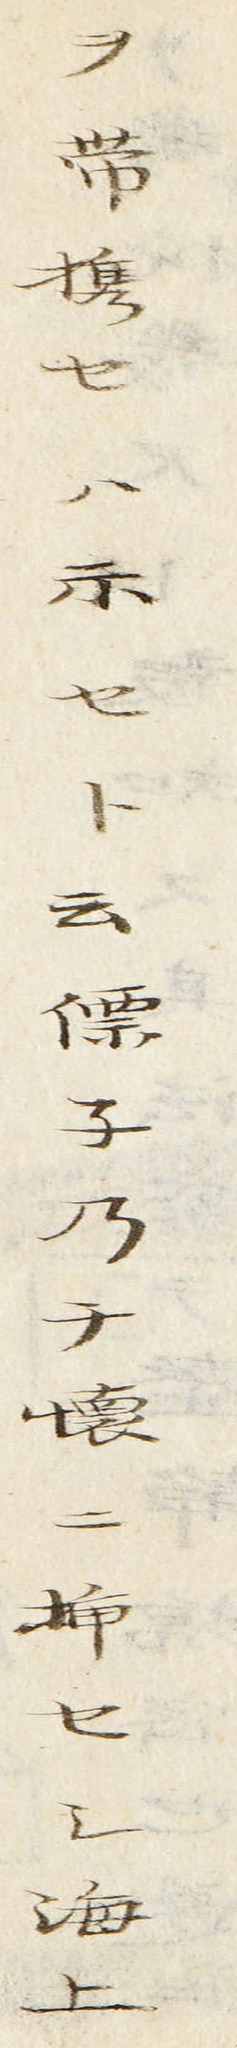ヲ帯携セハ示セト云僄子乃チ懐ニ挿セシ海上
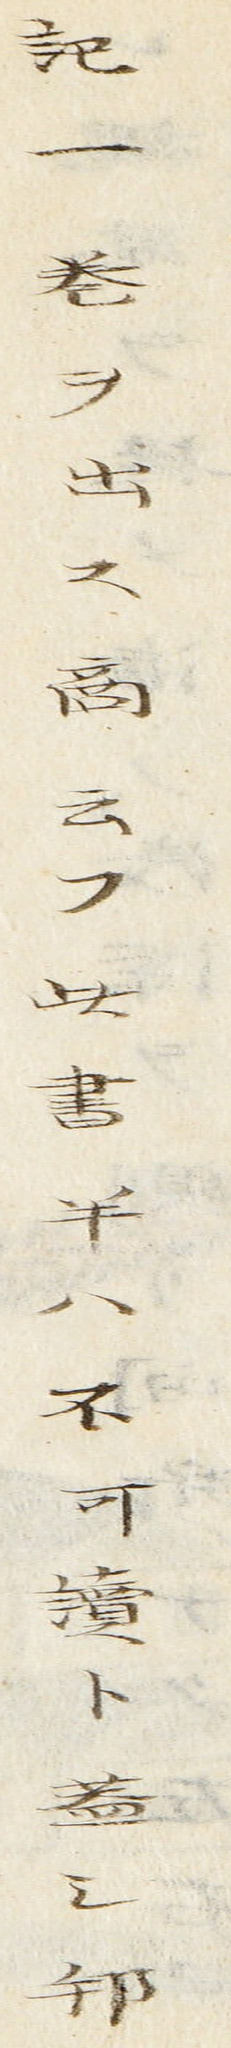記一巻ヲ出ス商云フ此書半ハ不可読ト蓋シ邦
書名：流蕃通書
